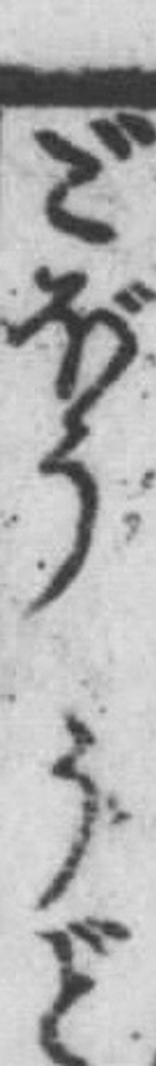ごぼう
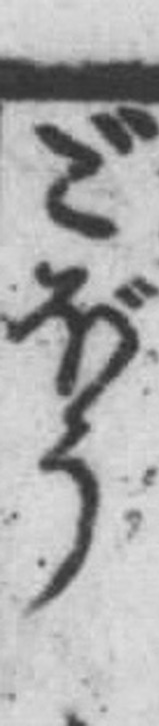ごぼう
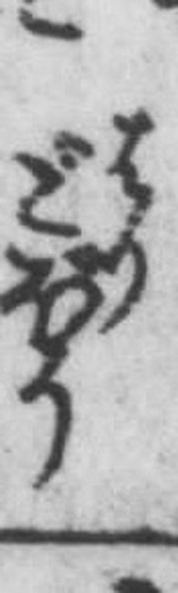ごぼう
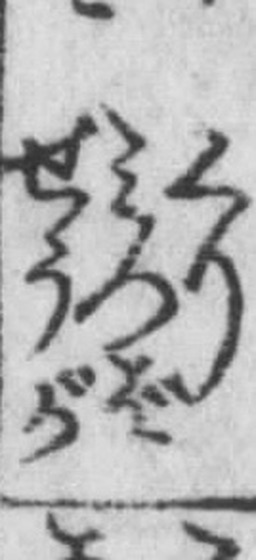せうが
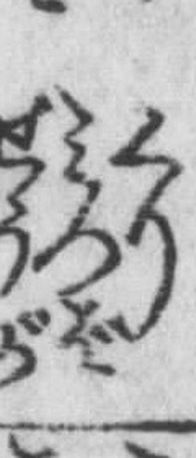せうが
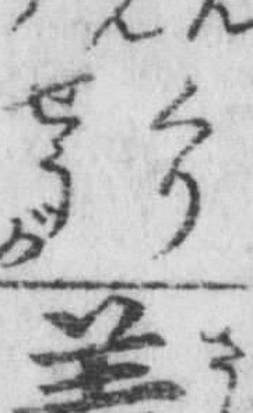せうが
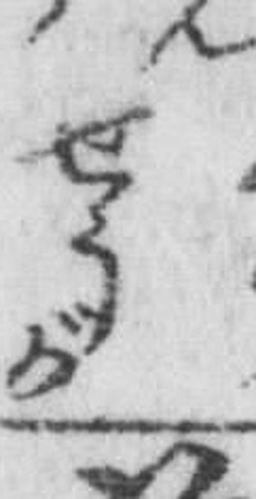せうが
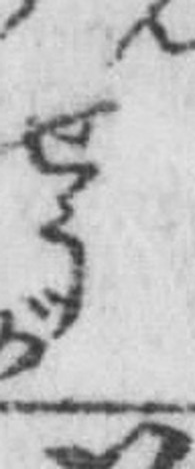せうが
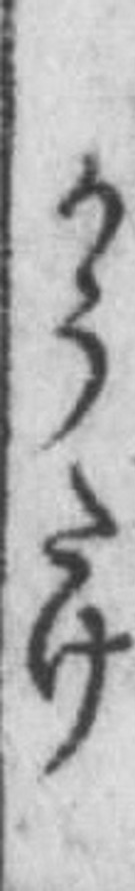かうたけ
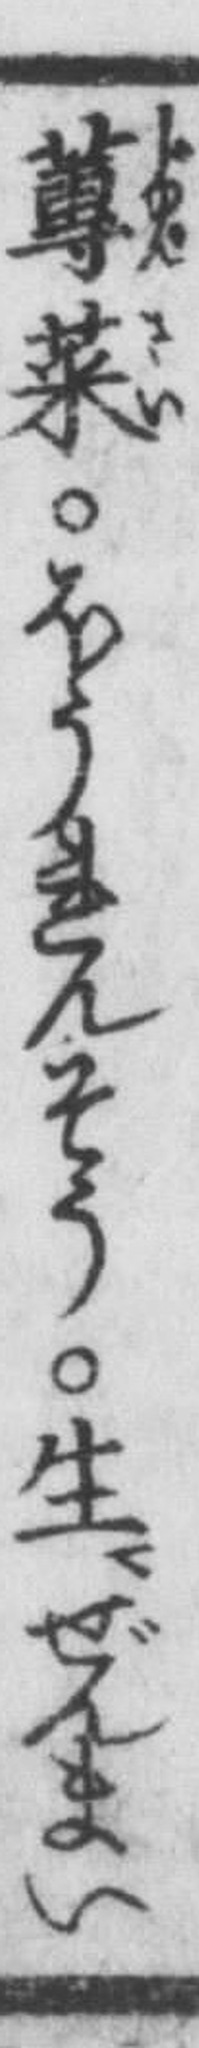蒪菜ほうれんそう生ぜんまい
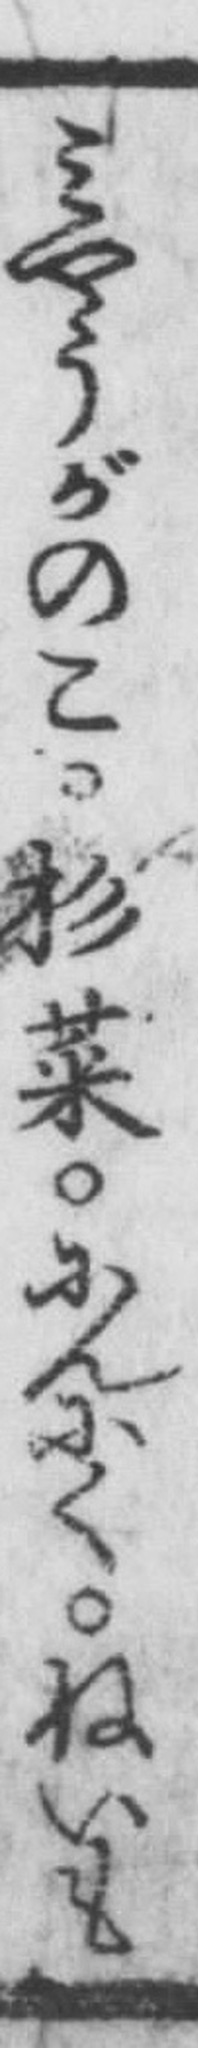ミやうがのこ杉菜にんにくねいも
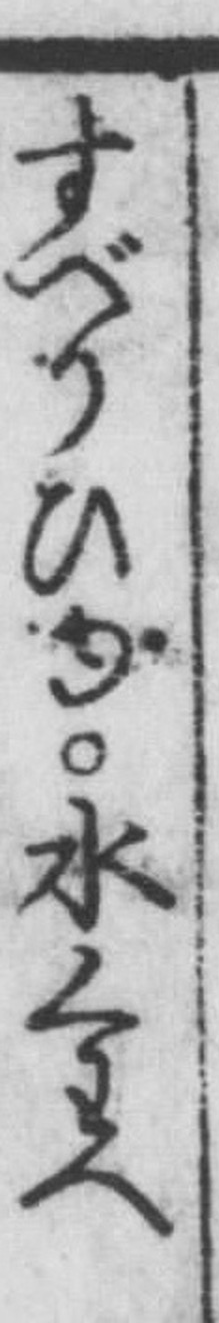すべりひゆ水くわい
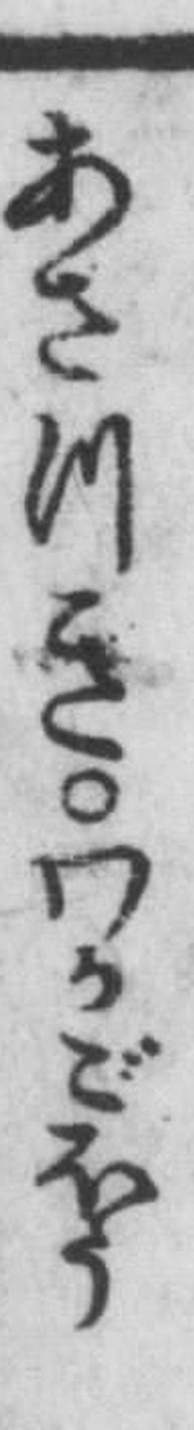あさつきワかごぼう
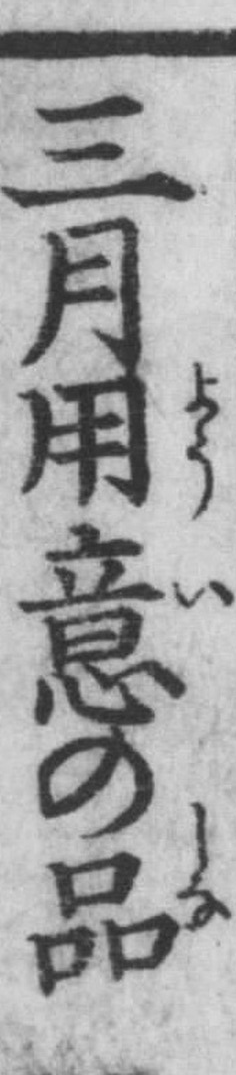三月用意の品
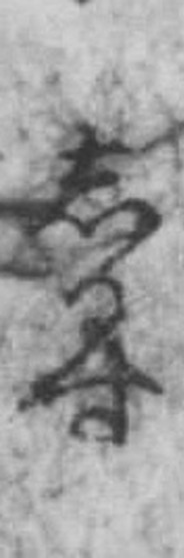しるす

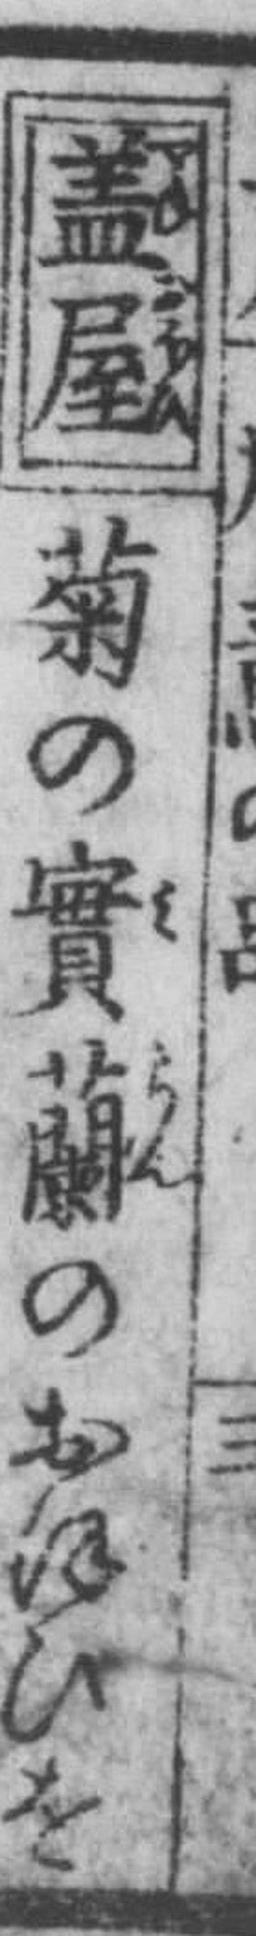盖屋菊の實蘭のおほひを
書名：当世料理筌
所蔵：大阪府立大学学術情報センター 国文学研究資料館
